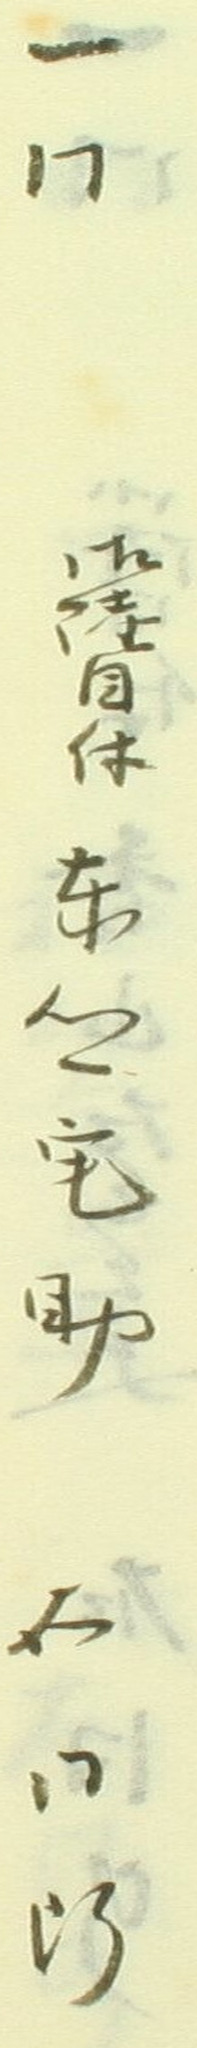一同御陸目付本郷宅助右同断
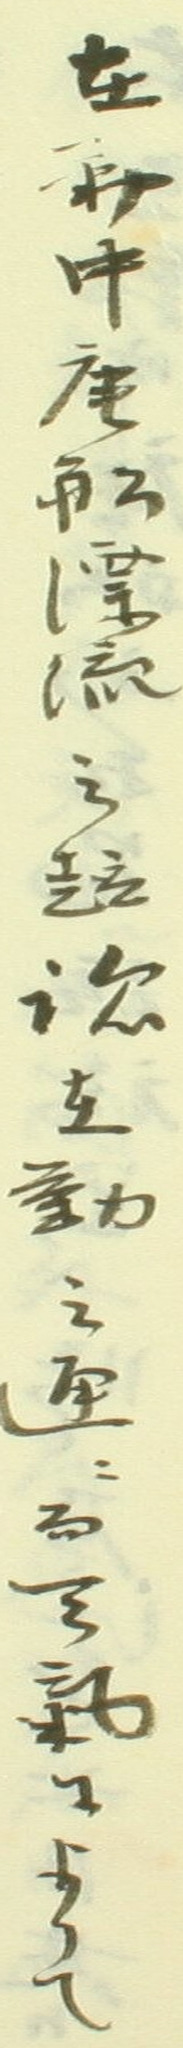在勤中唐船漂流之趣諸在勤之通に而天気によりて
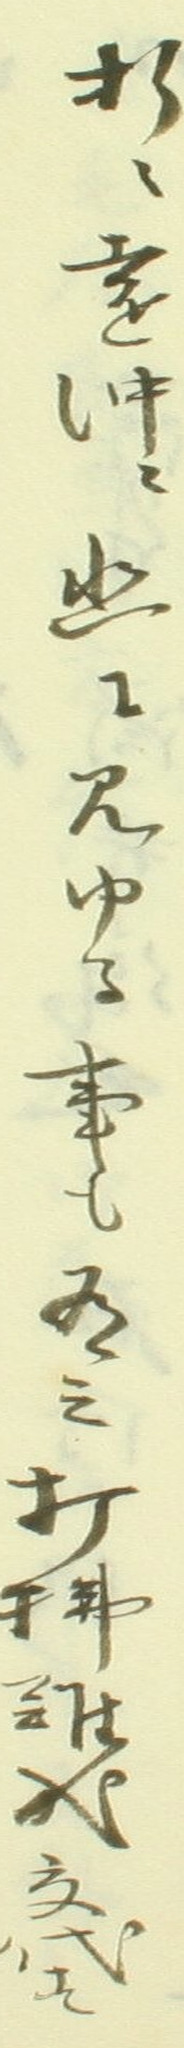折々遠沖に遥に見ゆる事も有之打払難成交代す
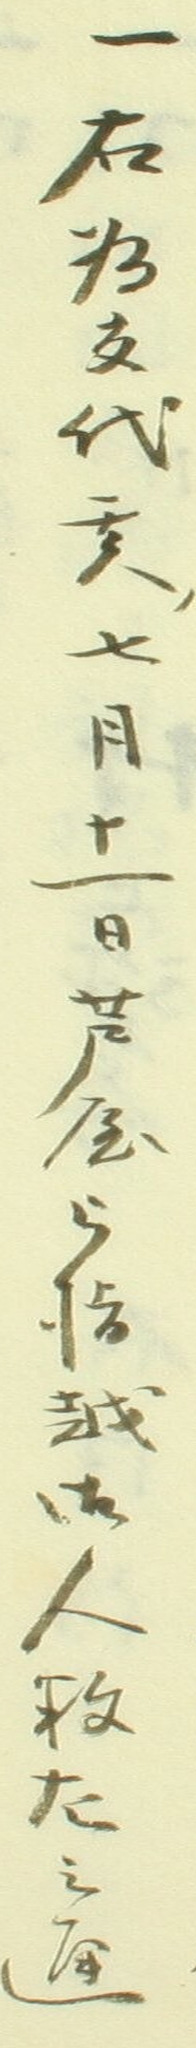一右為交代亥の七月十一日芦屋被指越御人数左之通
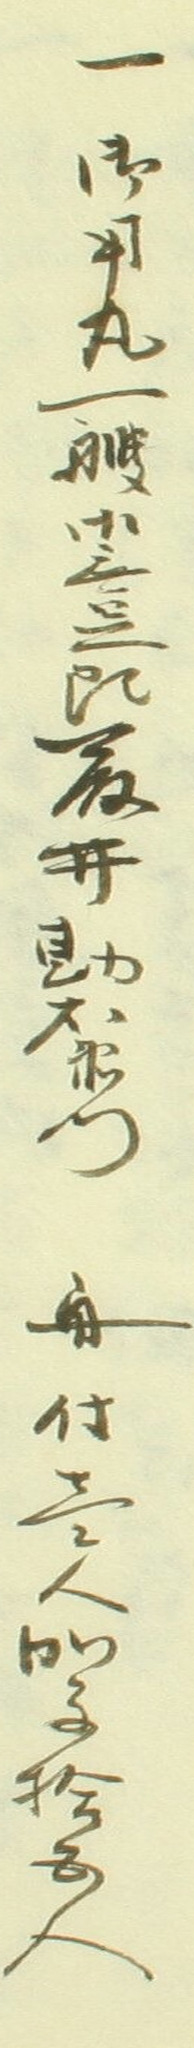一御用丸一艘御無足頭藤井勘右衛門舟付一人加子拾五人
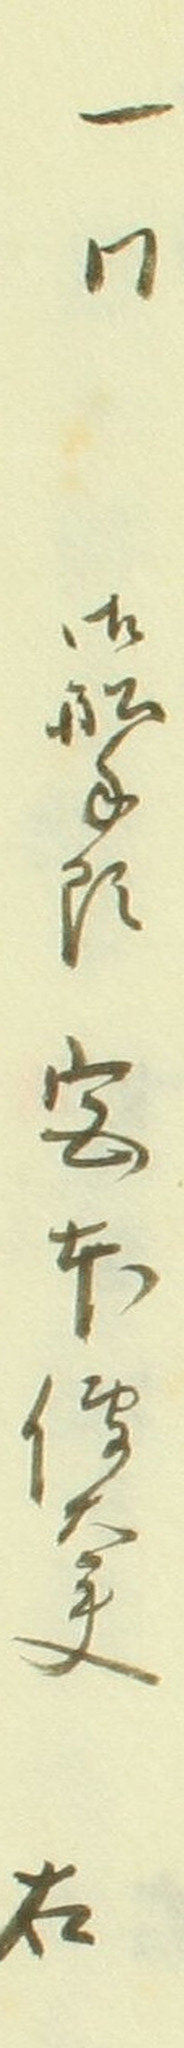一同御船手頭宮本伝太夫右同断
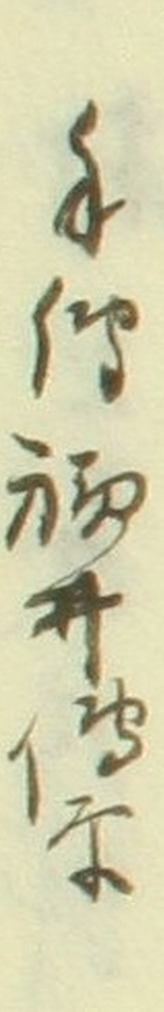手伝福井伝平

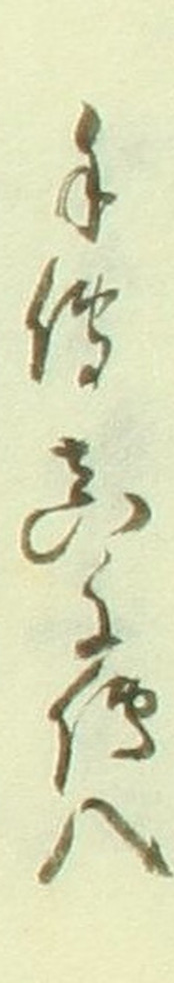手伝ま真子伝八
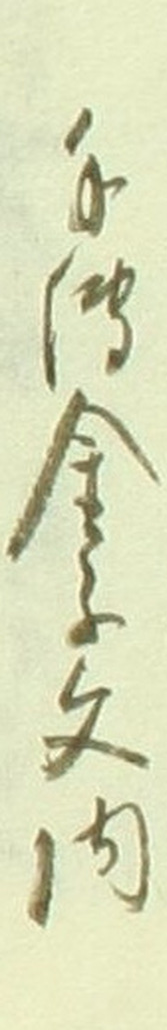手伝金子文内
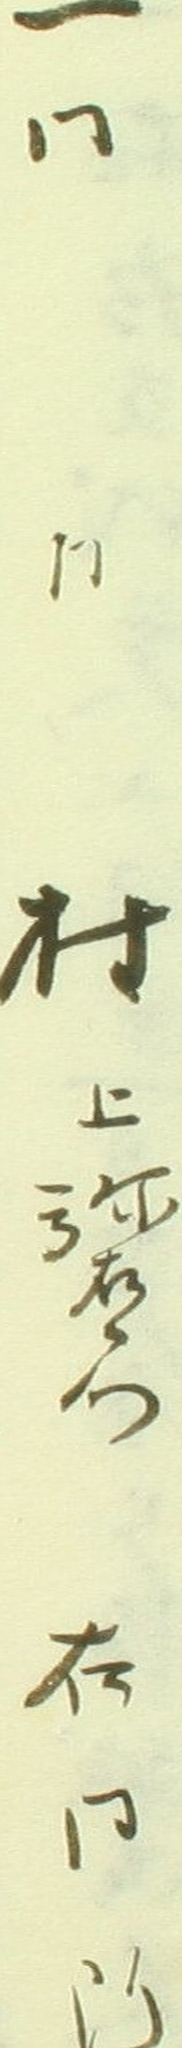一同同村上弥平太右同断
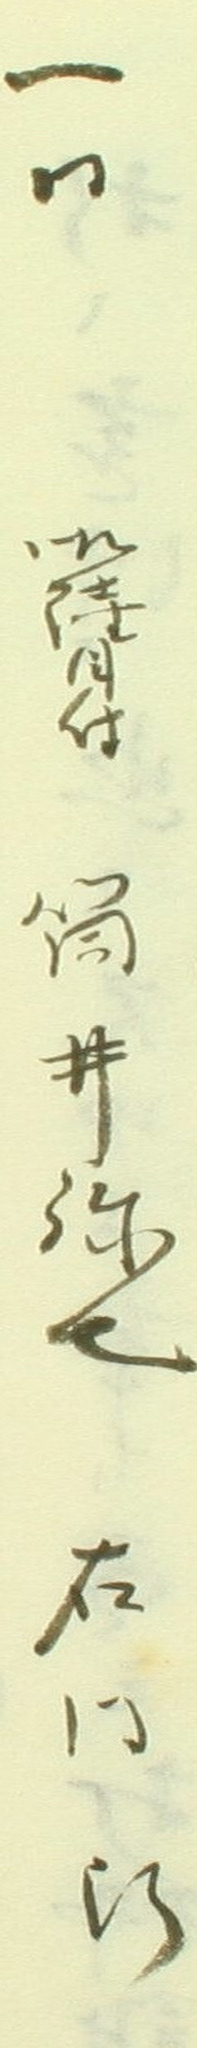一同御陸目付筒井や七右同断
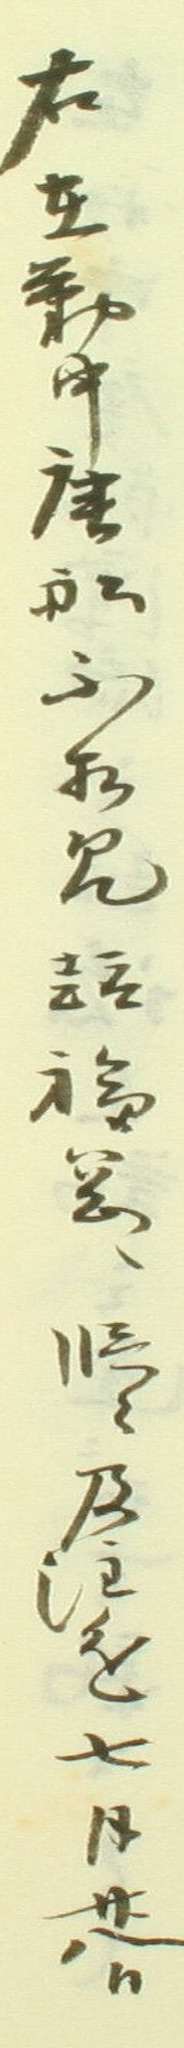右在勤中唐船不相見趣福岡ヘ段々注進七月廿八日
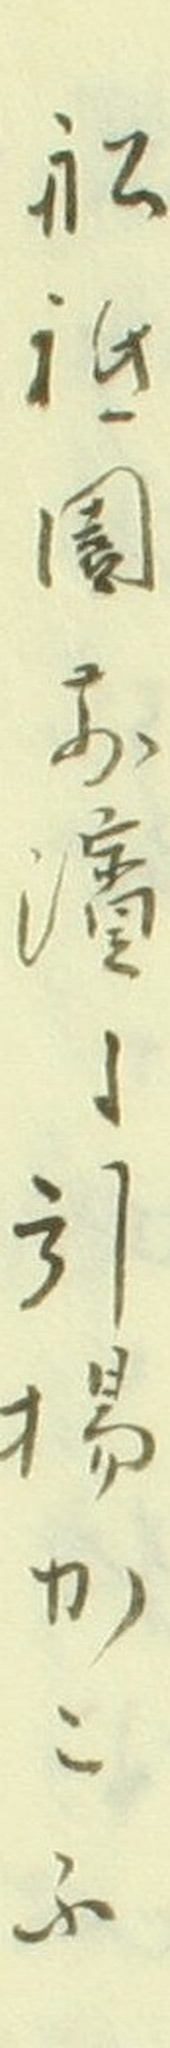船祇園前浜に引揚かこふ
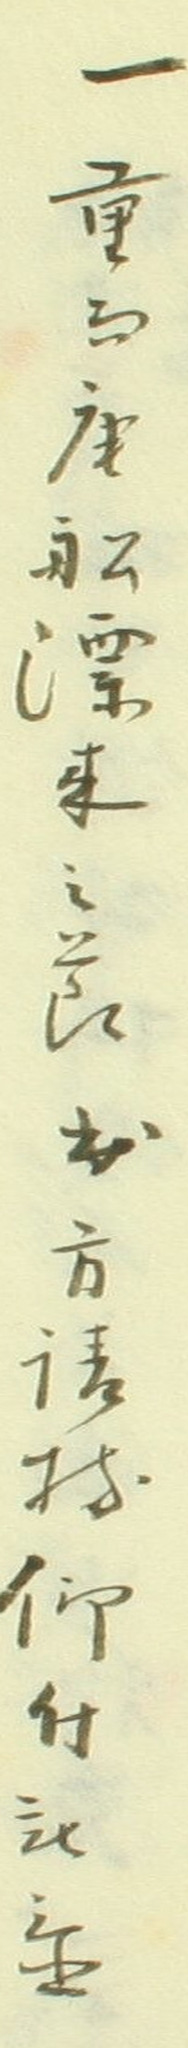一重而唐船漂来之節出方請持仰付被置
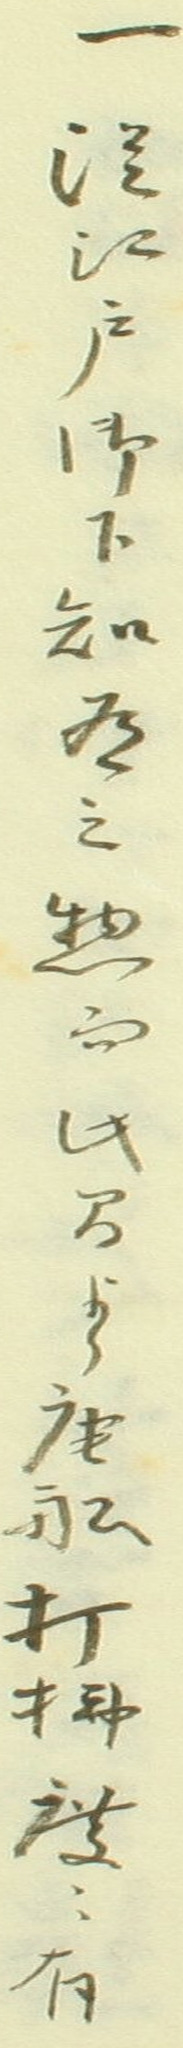一従江戸御下知為之惣而此間より唐船打払度々有
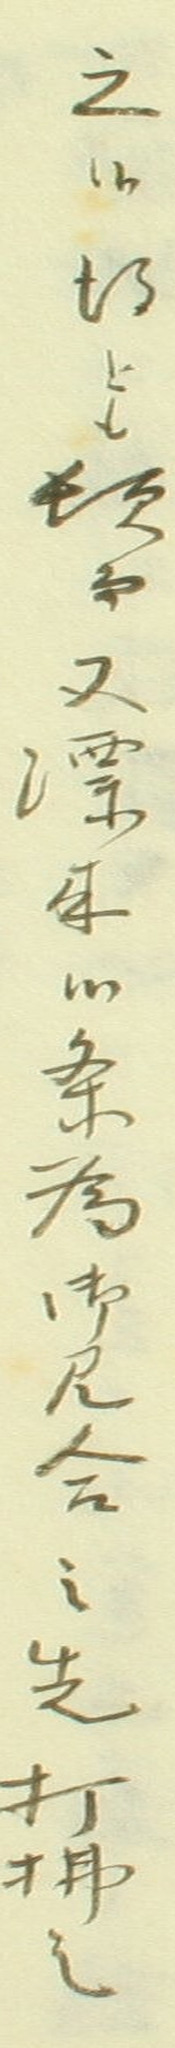之候得とも頼而又漂来御条為御見合之先打払之
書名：唐船漂流記 三
